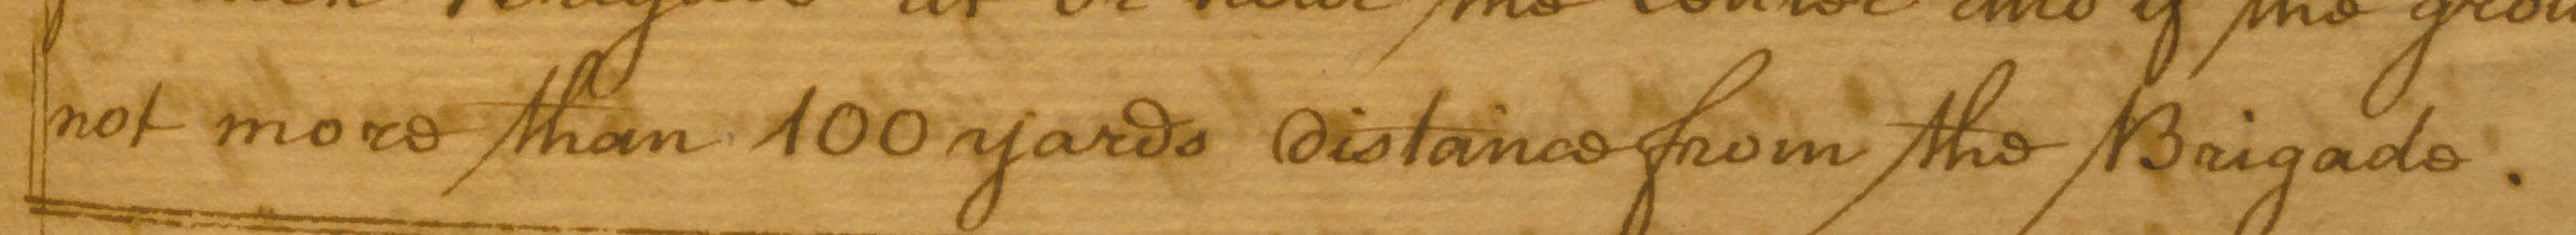not more than 100 yards distance from the Brigade.
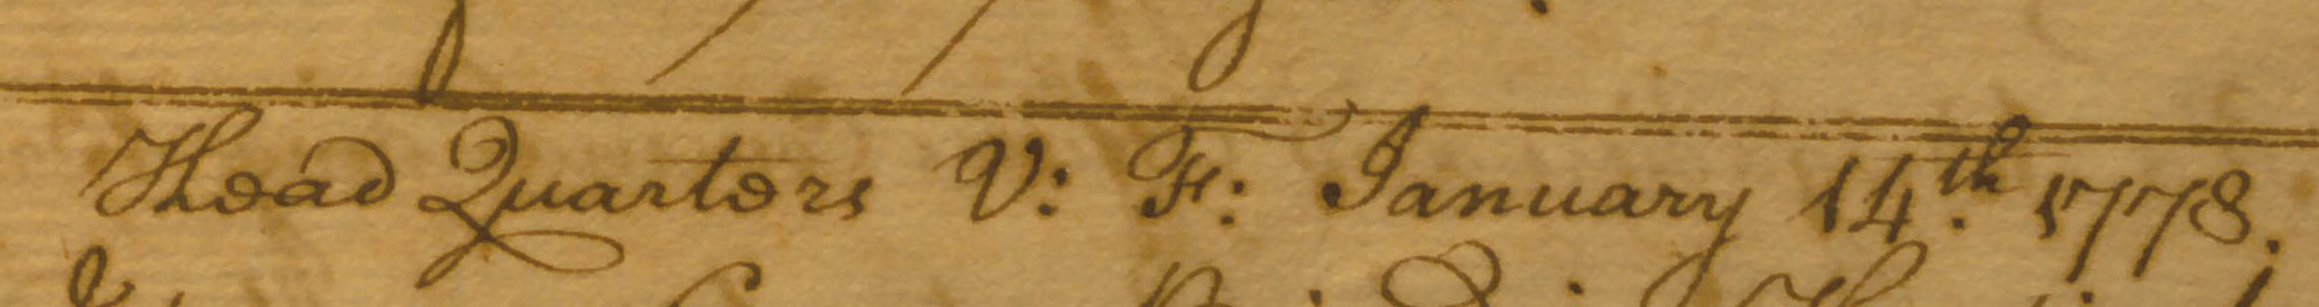Head Quarters V: F: January 14^th. 1778.
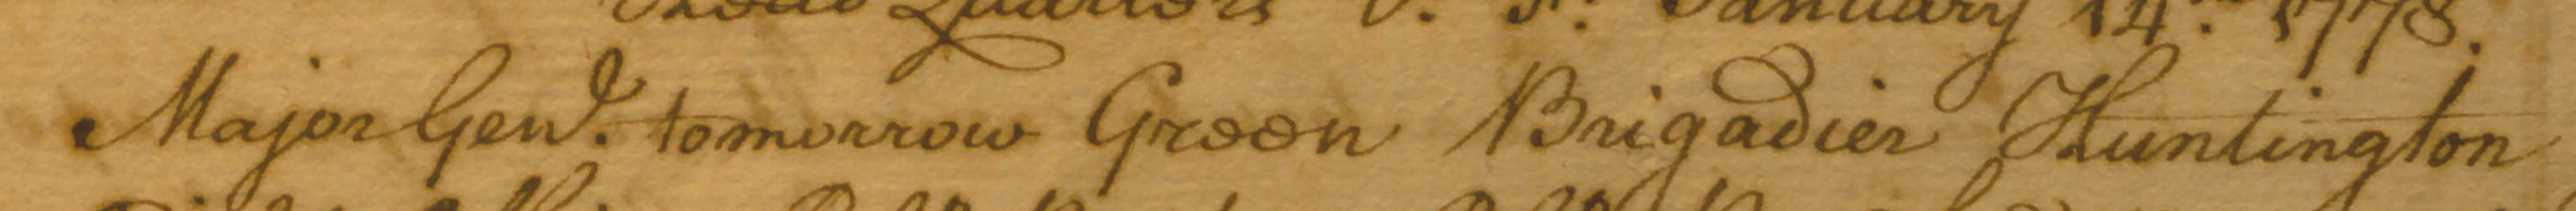Major Gen^l. tomorrow Green Brigadier Huntington
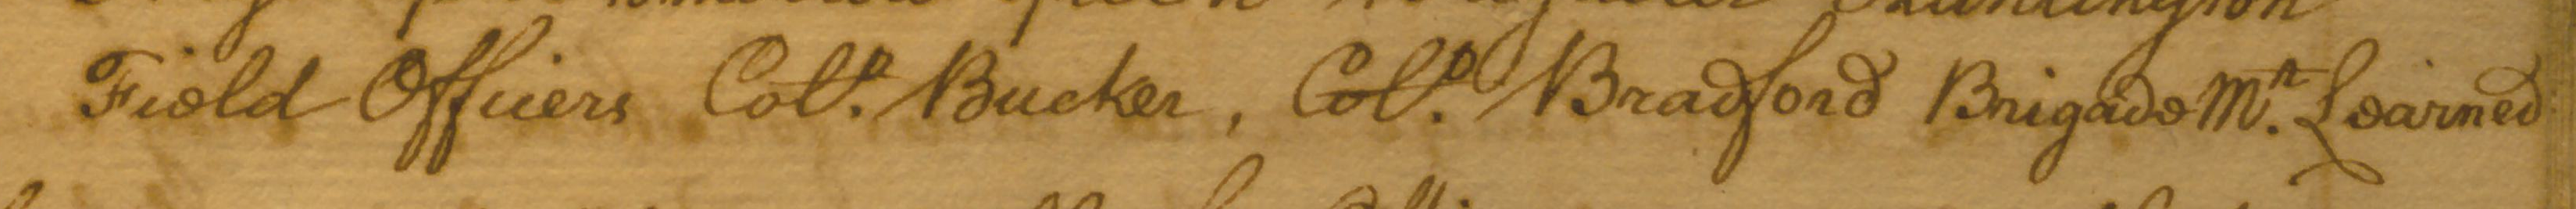Field Officers Col^o. Bucker, Col^o. Bradford Brigade M^r. Learned
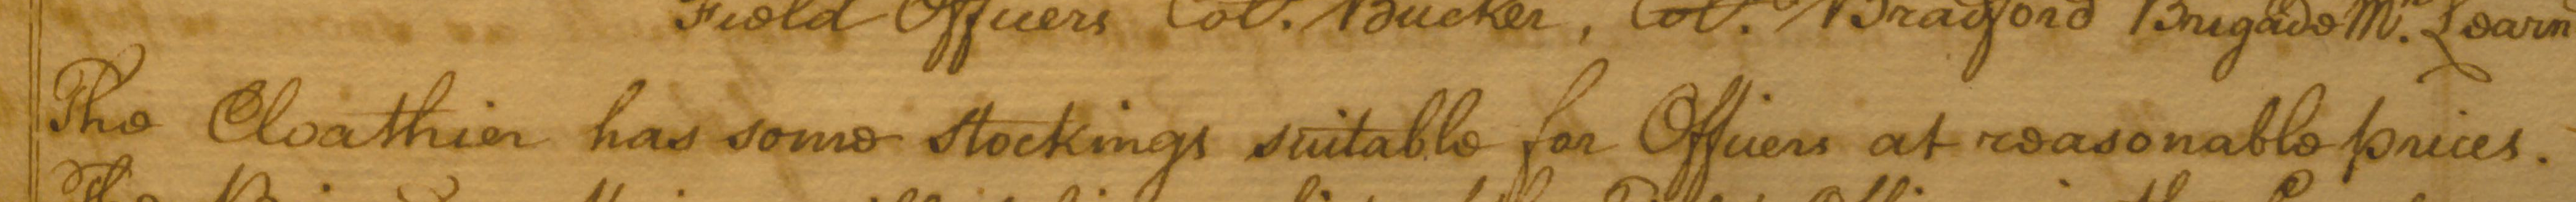The Cloathier has some stockings suitable for Officers at reasonable prices.
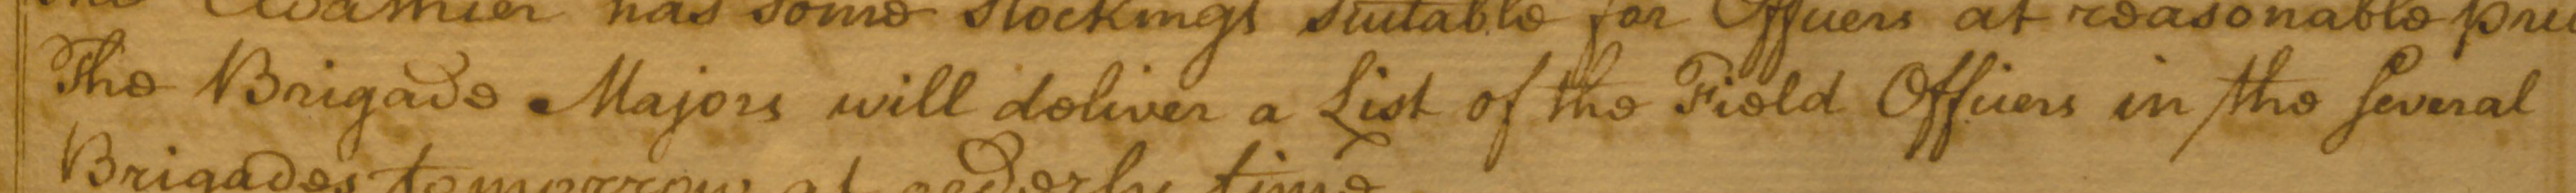The Brigade Majors will deliver a List of the Field Officers in the several
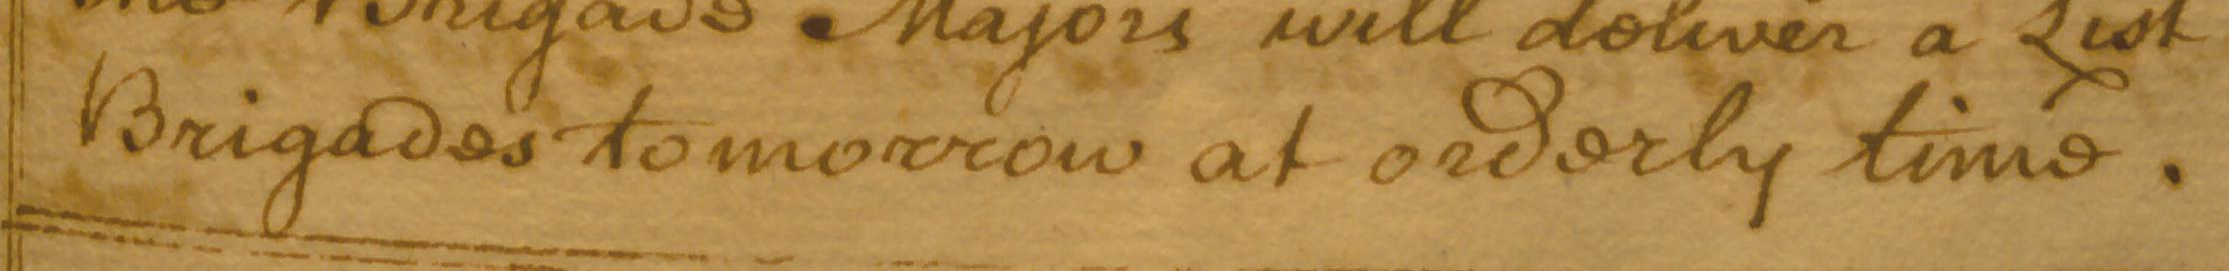Brigades tomorrow at orderly time.
